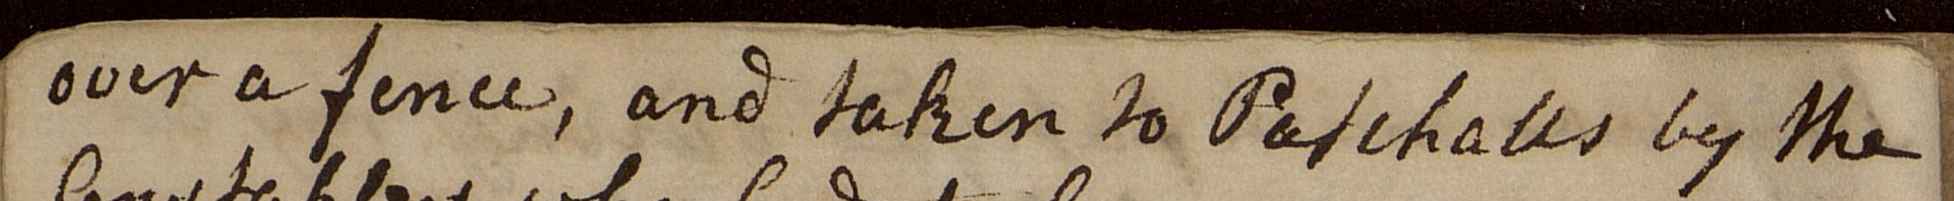over a fence, and taken to Paschalls by the
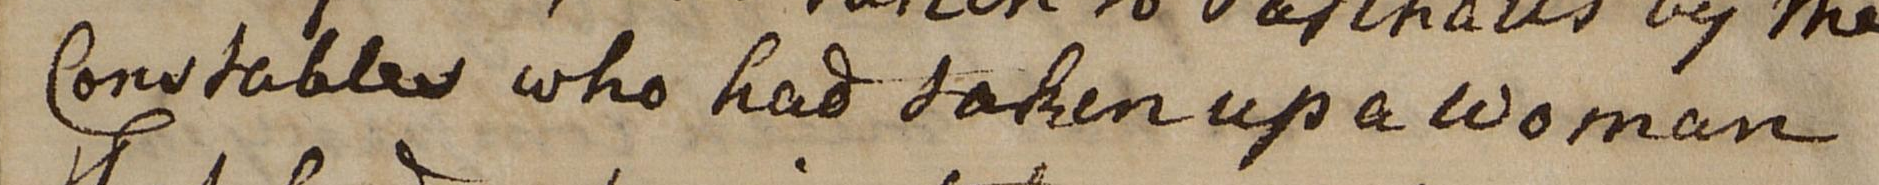Constables who had taken up a Woman
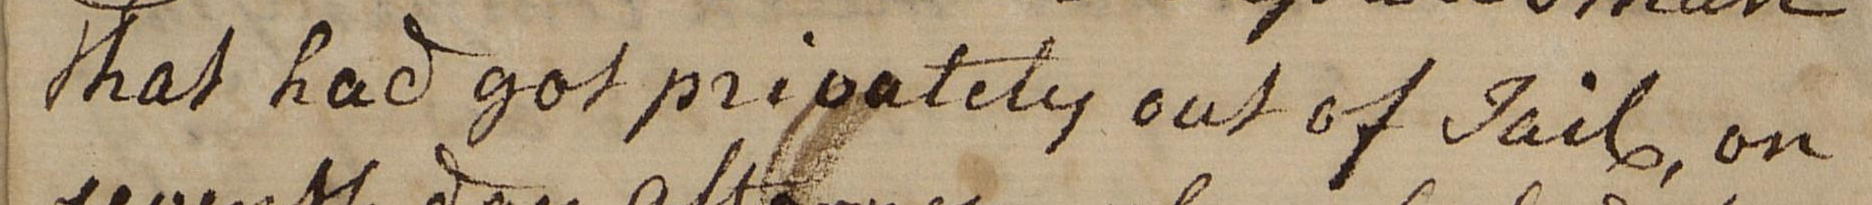that had got privately out of Jail, on
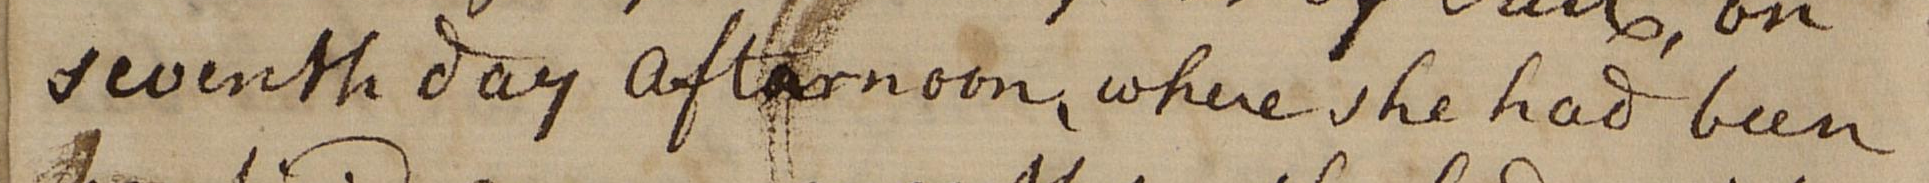seventh day afternoon, where she had been
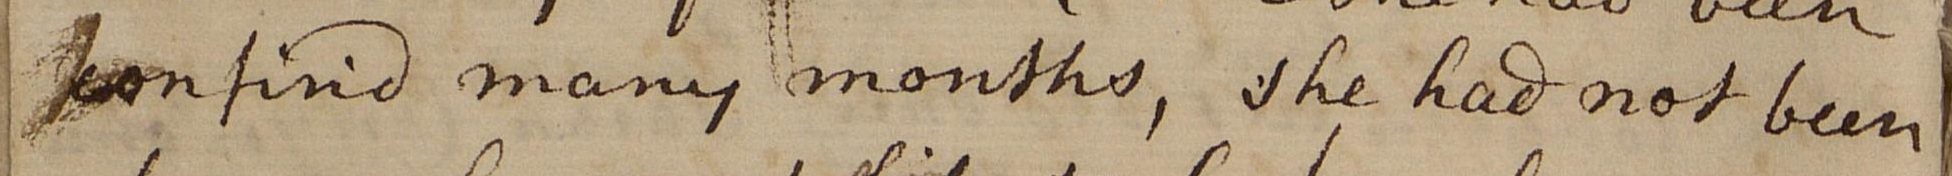confin'd many months, she had not been
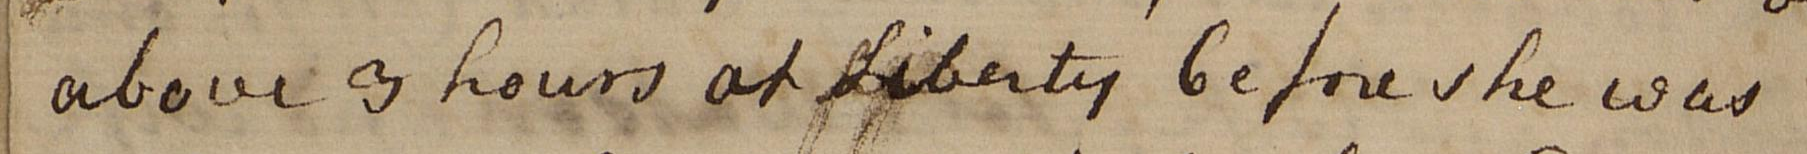above 3 hours at Liberty before she was
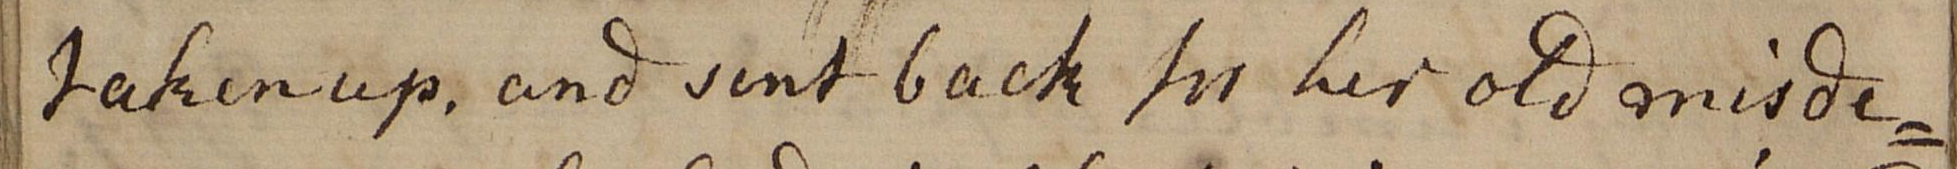taken up, and sent back for her old misde-
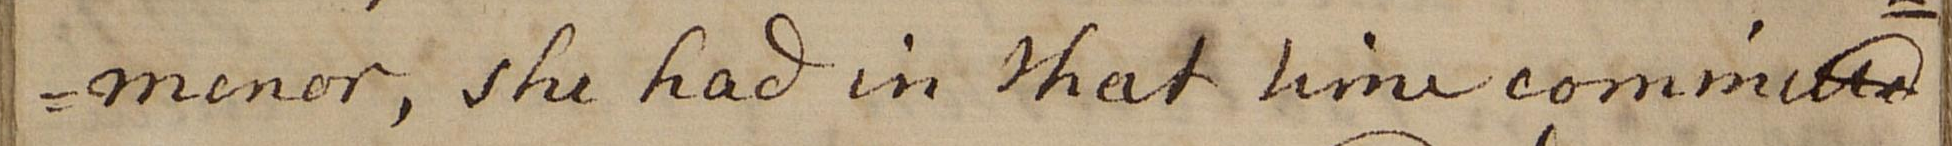-manor, she had in that time committed
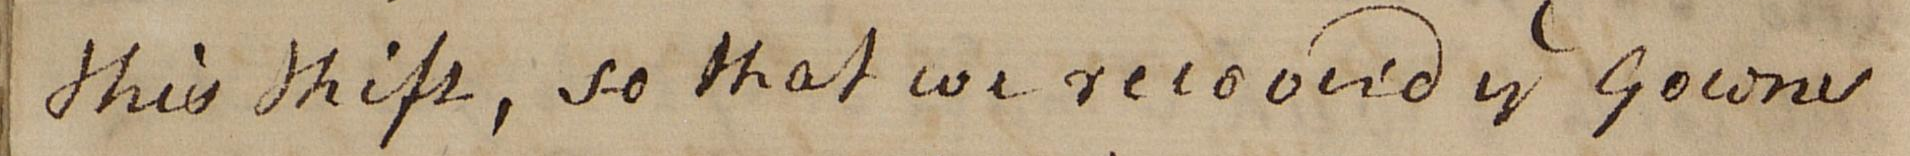this shift, so that we recover'd y^e Gowns
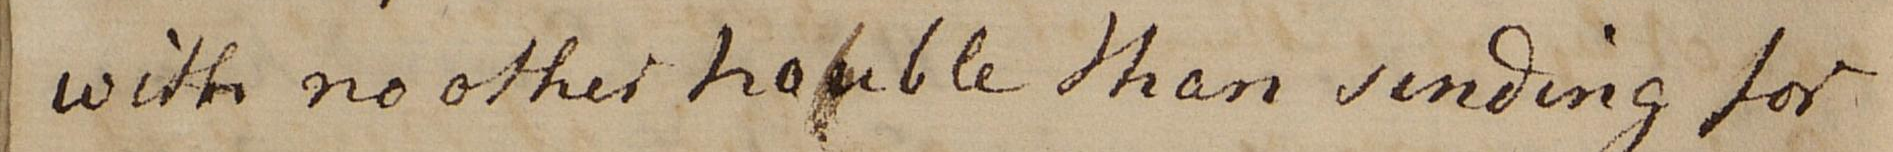with no other trouble than sending for
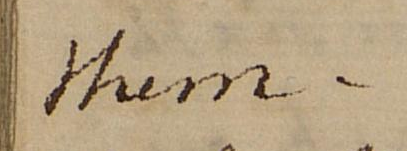them-
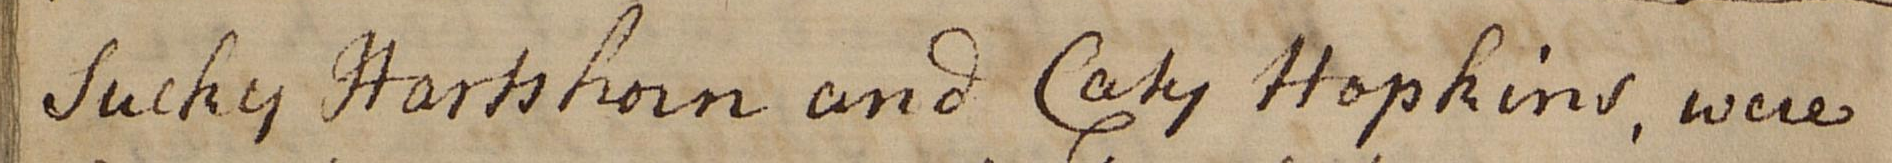Sucky Hartshorn and Caty Hopkins, were
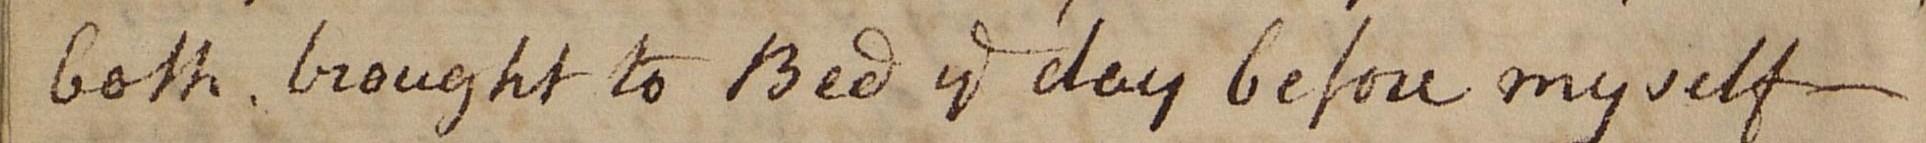both, brought to Bed y^e day before myself-
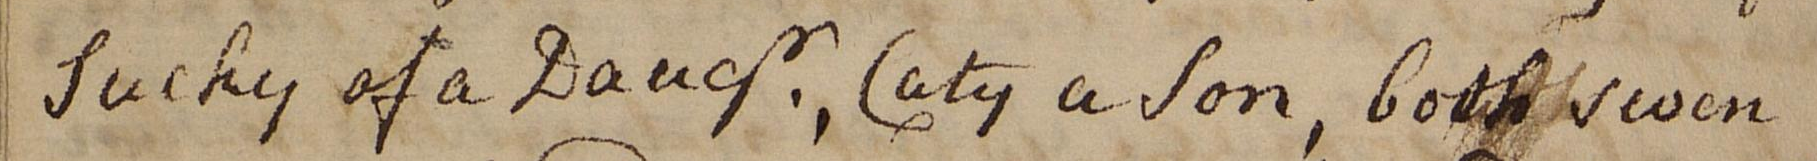Sucky of a Daug^r. Caty a Son, both seven
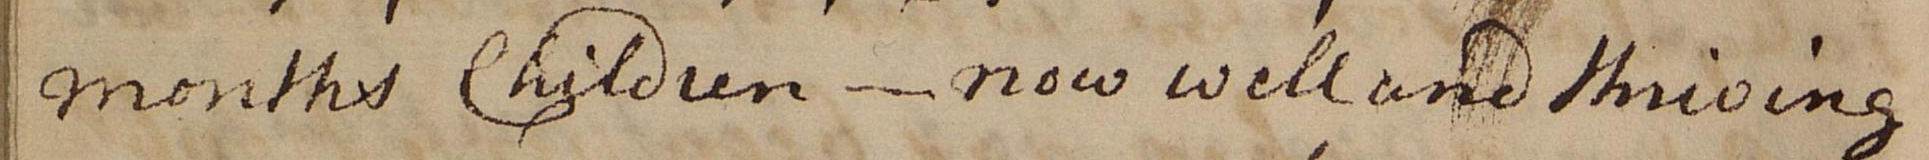months Children- now well and thriving
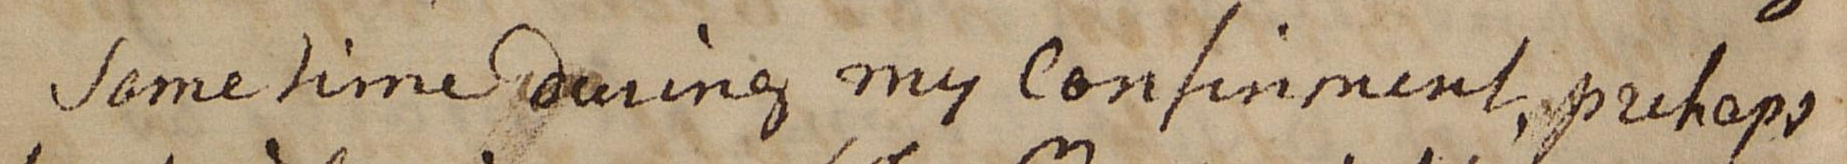Sometime during my Confinment, prehaps
